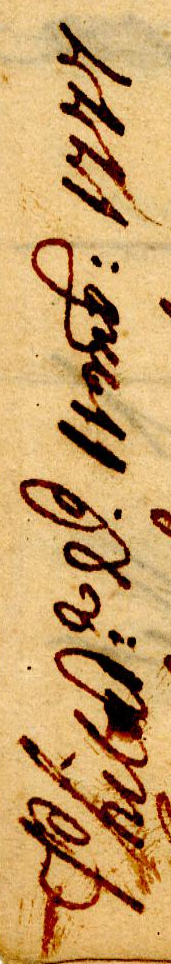Philad:^a 11 mo: 1777
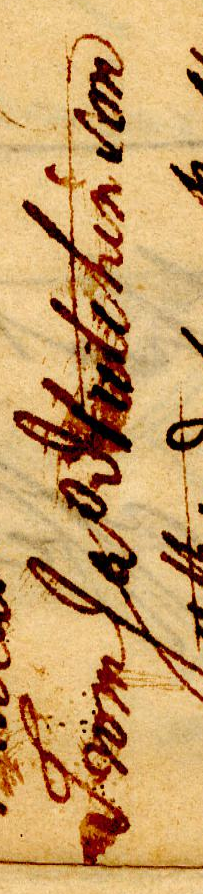From Ja^s Hutchinson
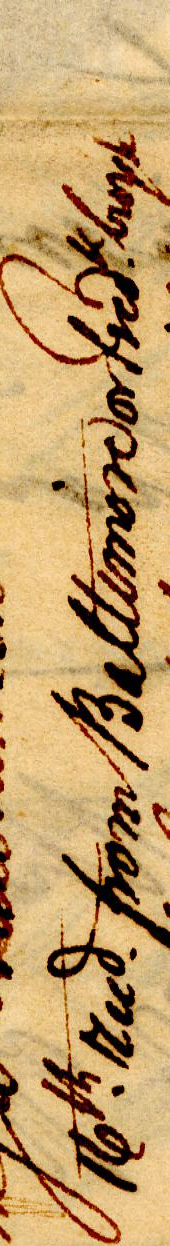16^th. recd. from Baltimore Fred^k. Groyk
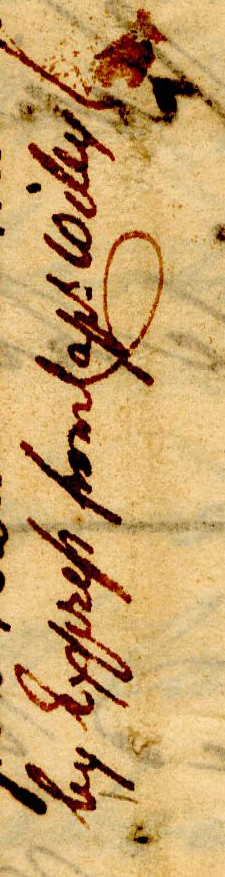by Express from Cap^t. Wiley
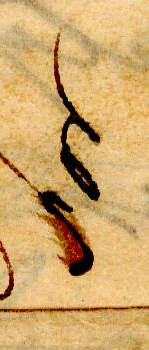For
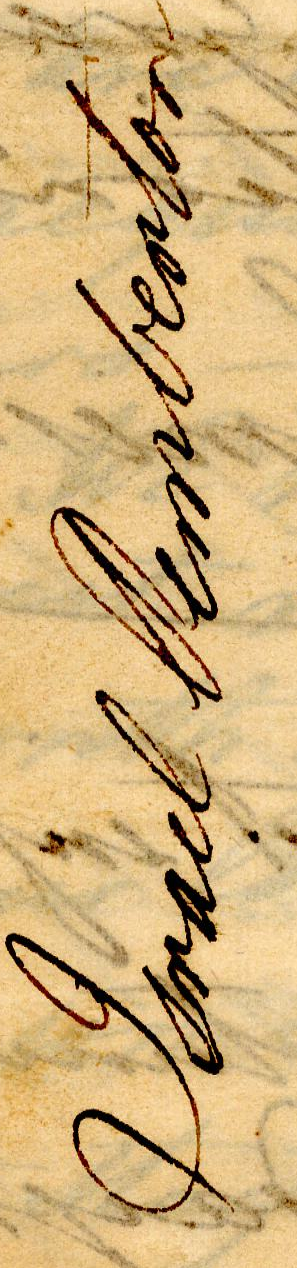Israel Pemberton
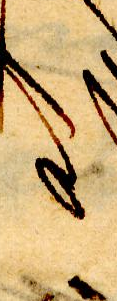at
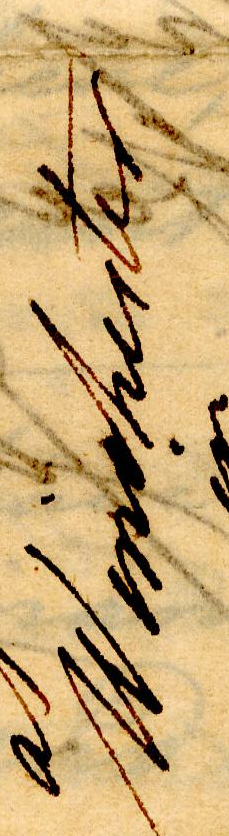Winchester
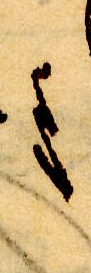in
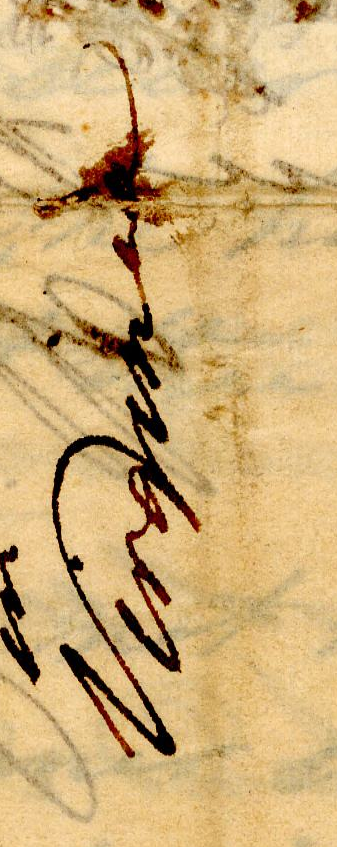Virginia
